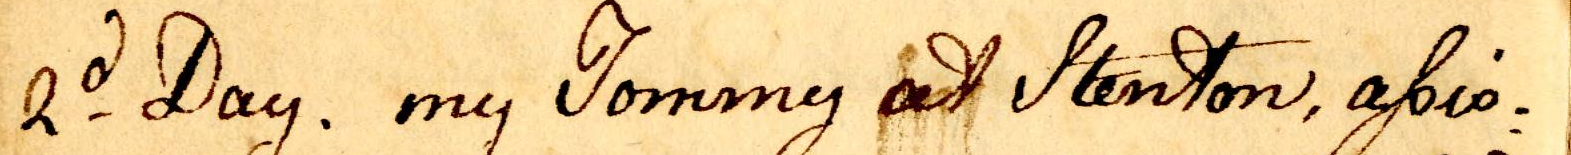2^d Day. my Tommy at Stenton, assis-
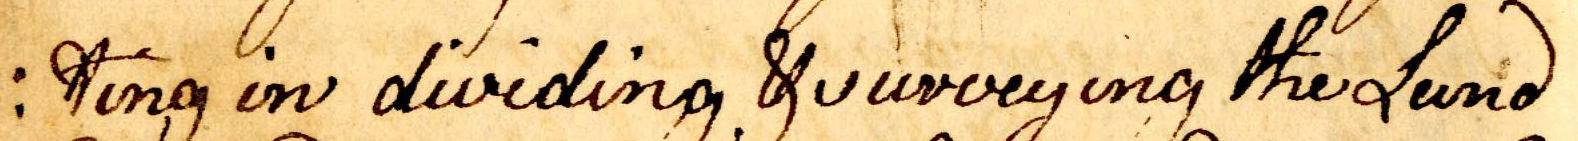-ting in dividing & surveying the Land
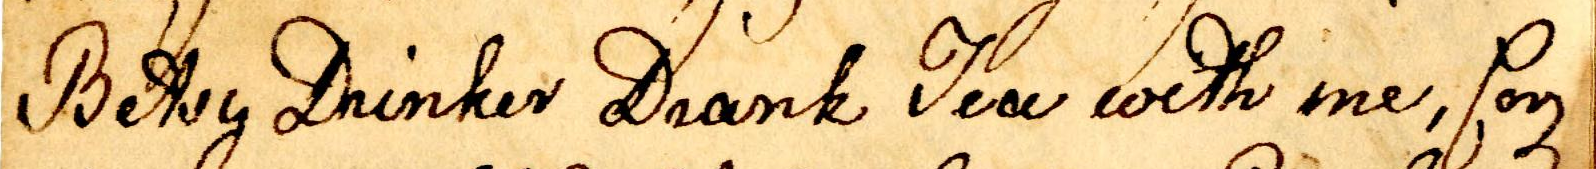Betsy Drinker Drank Tea with me, Coz
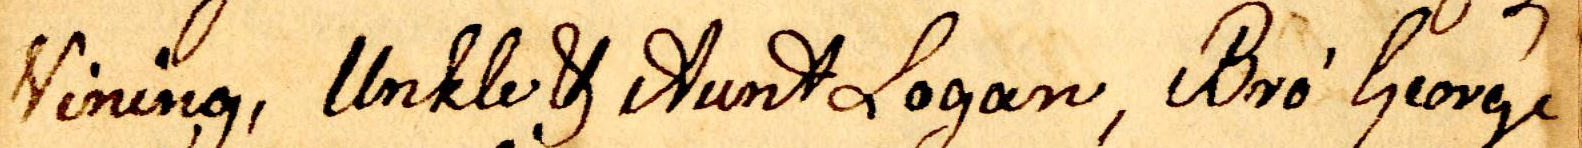Vining, Unkle & Aunt Logan, Bro' George
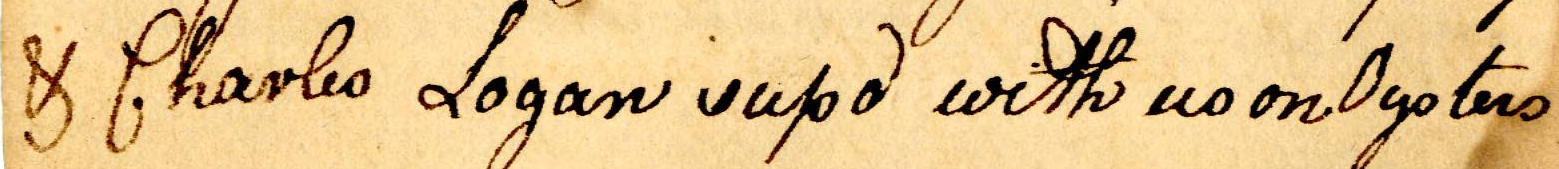& Chalres Logan supd with us on Oysters
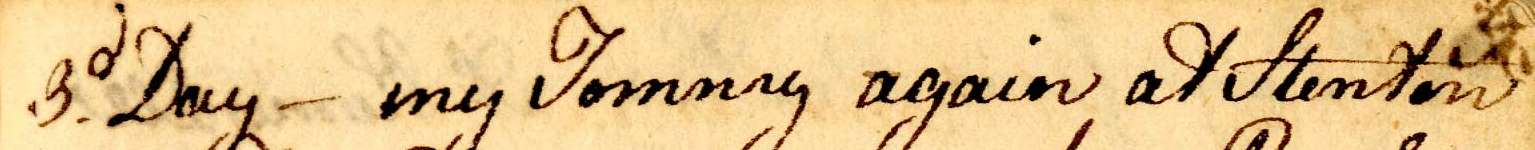3^d. Day- my Tommy again at Stenton
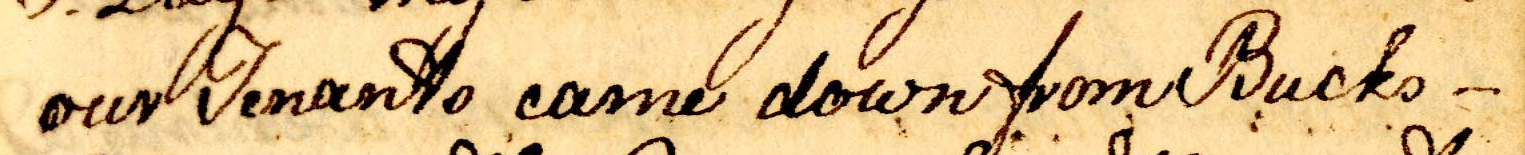our Tenants came down from Bucks-
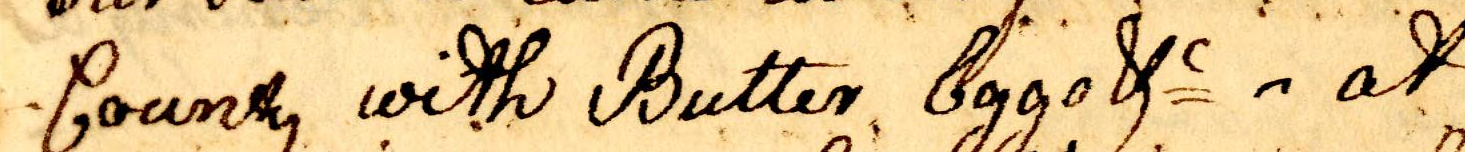-County with Butter, Eggs &^c at
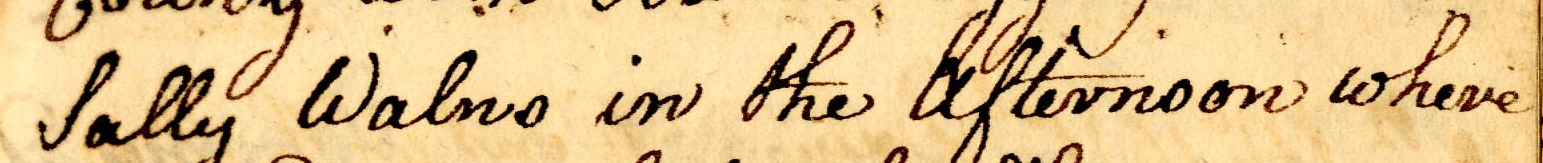Sally Walns in the Afternoon where
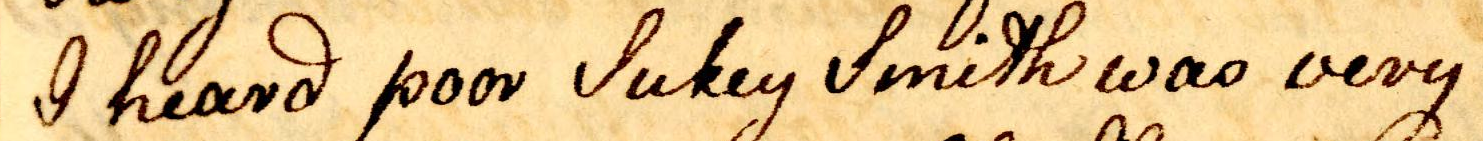I heard poor Sukey Smith was very
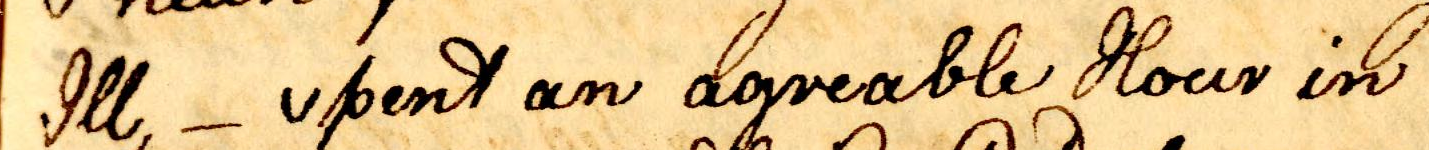Ill,- spent an agreable Hour in
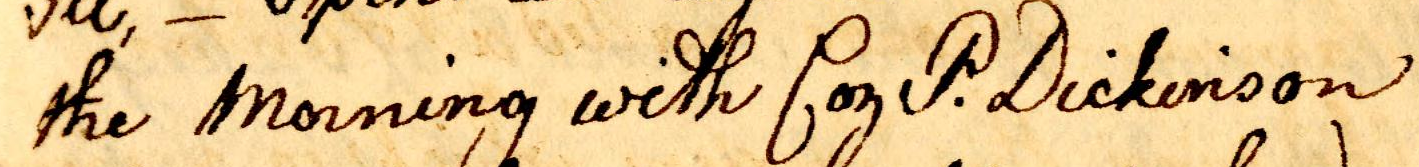the Morning with Coz P. Dickinson
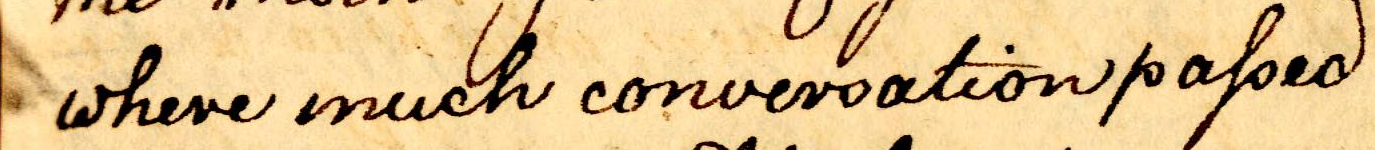where much conversation passed
